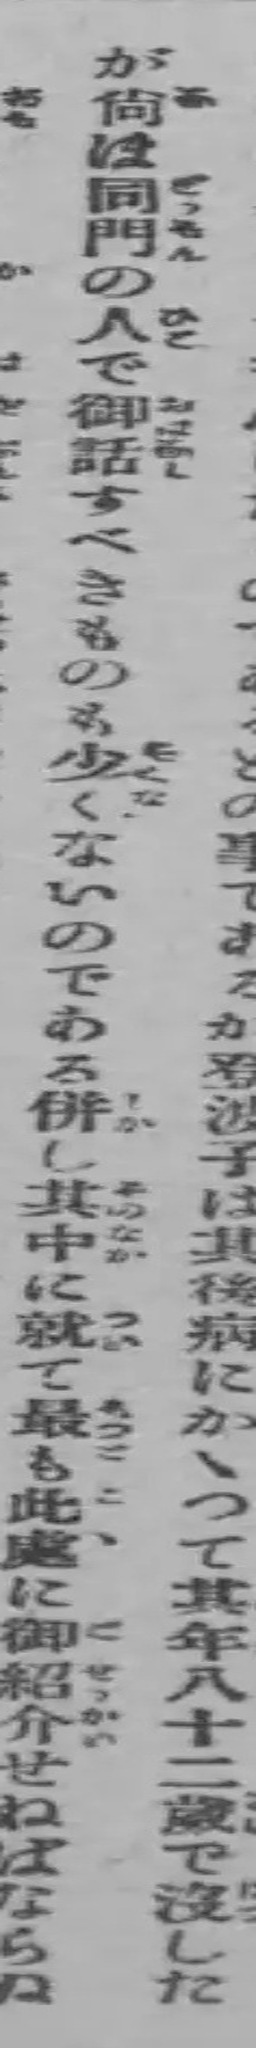が尚ほ同門の人で御話すべきものも少くないのである併し其中に就て最も此処に御紹介せねばならぬ
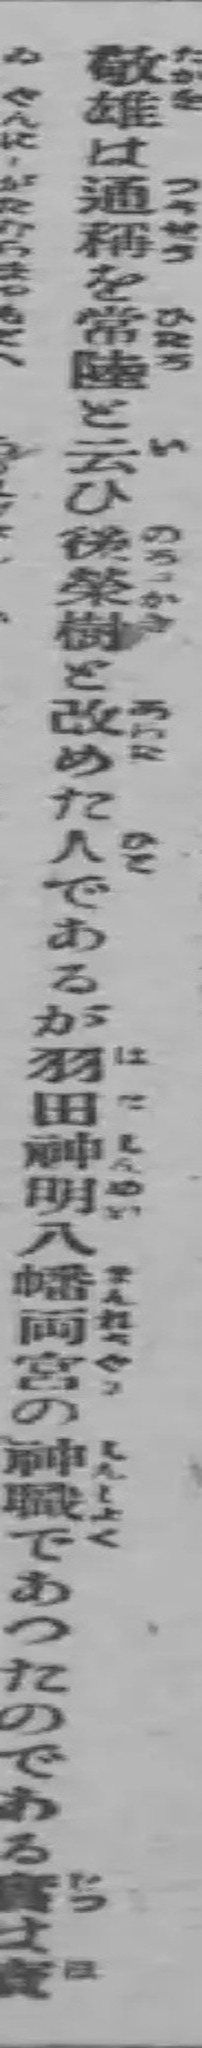敬雄は通称を常陸と云ひ後栄樹と改めた人であるが羽田神明八幡両宮の神職であつたのである実は宝
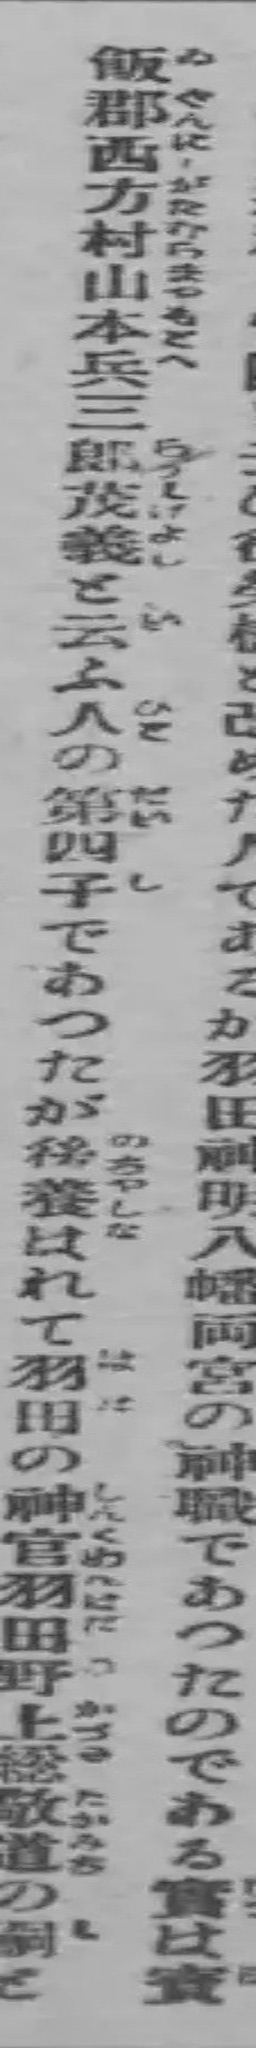飯郡西方村山本兵三郎茂義と云ふ人の第四子であつたが後養はれて羽田の神官羽田野上総敬道の嗣と
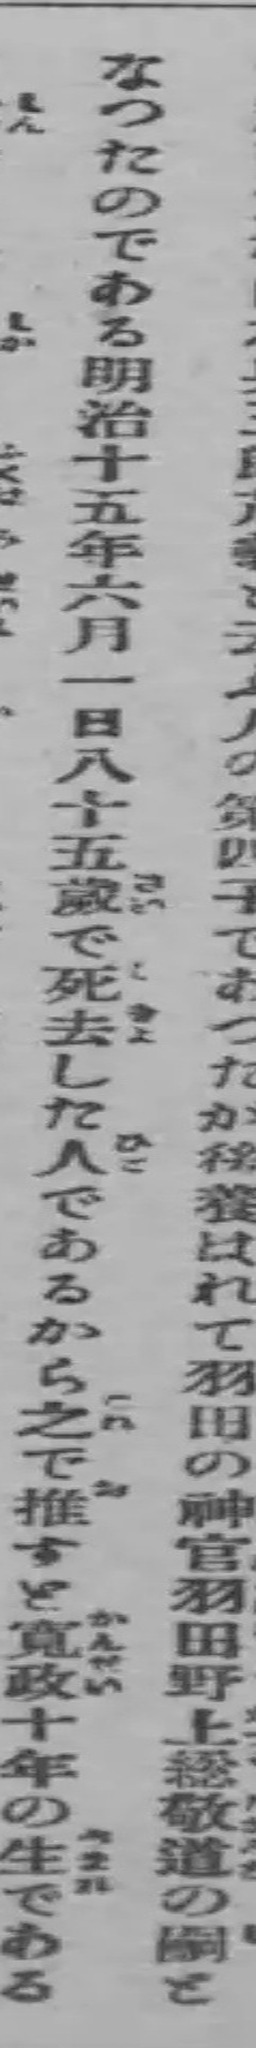なつたのである明治十五年六月一日八十五歳で死去した人であるから之で推すと寛政十年の生である
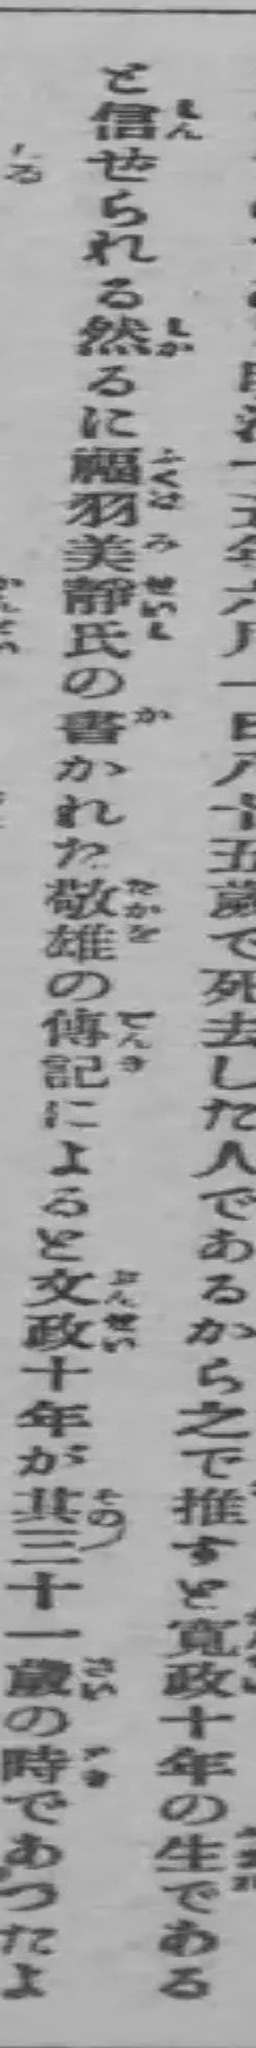と信ぜられる然るに福羽美静氏の書かれた敬雄の伝記によると文政十年が其三十一歳の時であつたよ
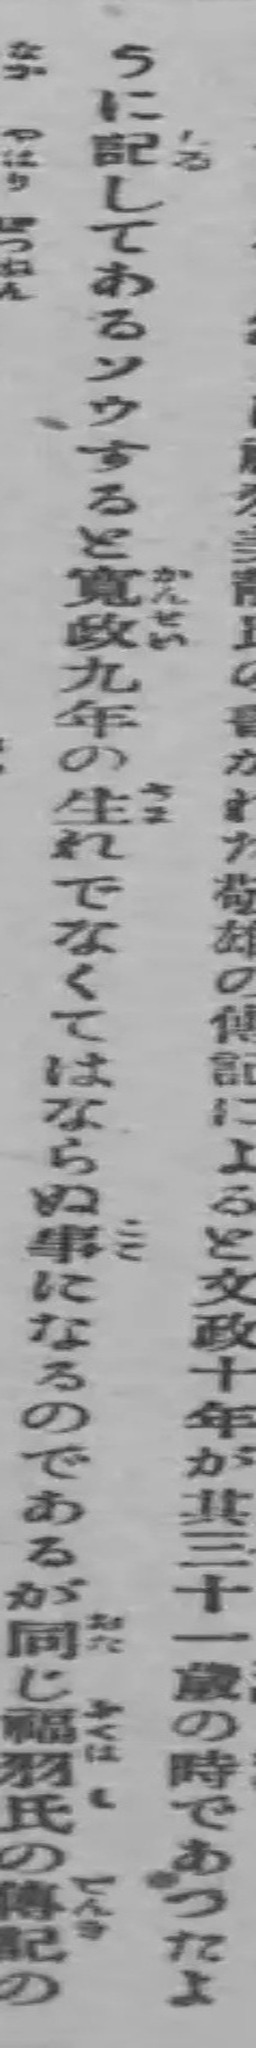うに記してあるソウすると寛政九年の生れでなくてはならぬ事になるのであるが同じ福羽氏の伝記の
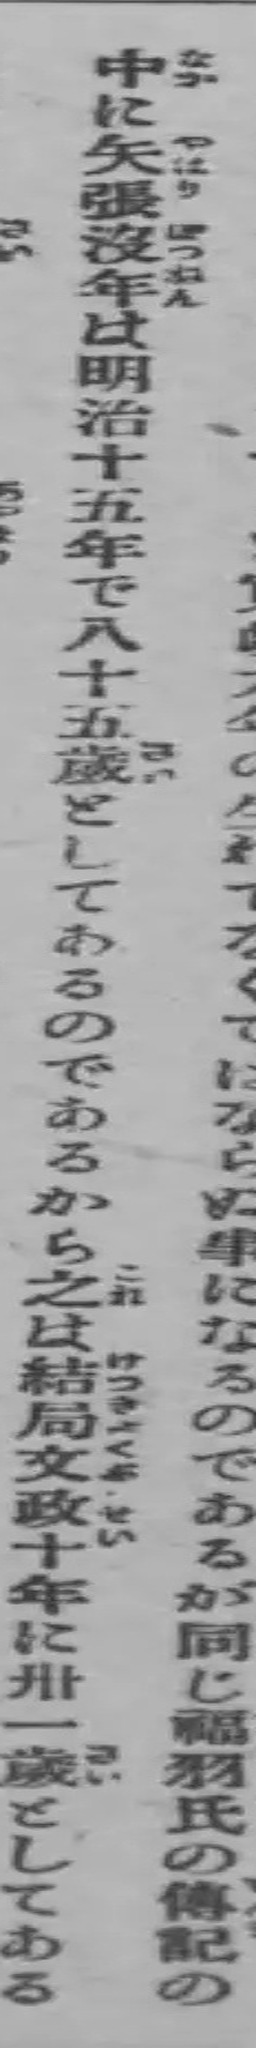中に矢張没年は明治十五年で八十五歳としてあるのであるから之は結局文政十年に卅一歳としてある
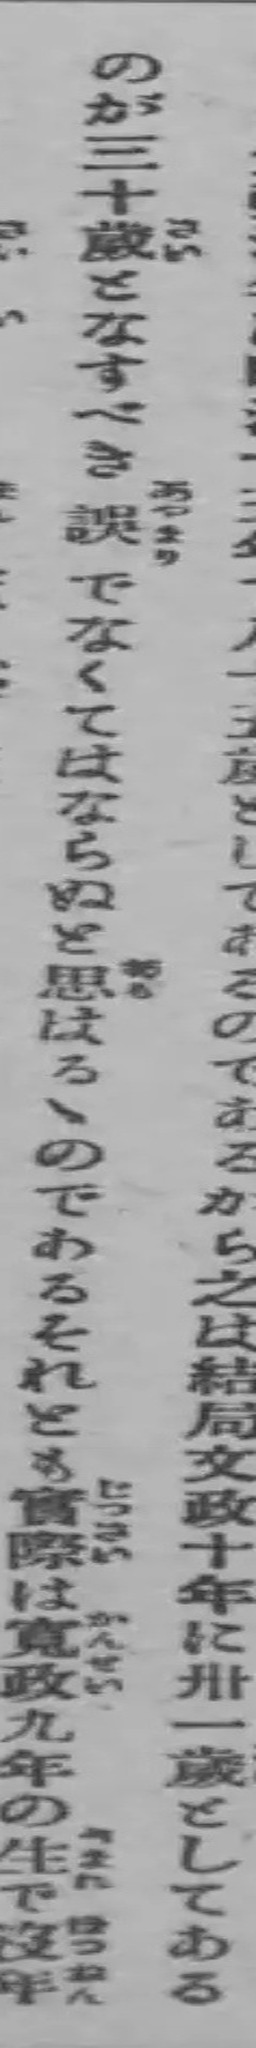のが三十歳となすべき誤でなくてはならぬと思はるゝのであるそれとも実際は寛政九年の生で没年
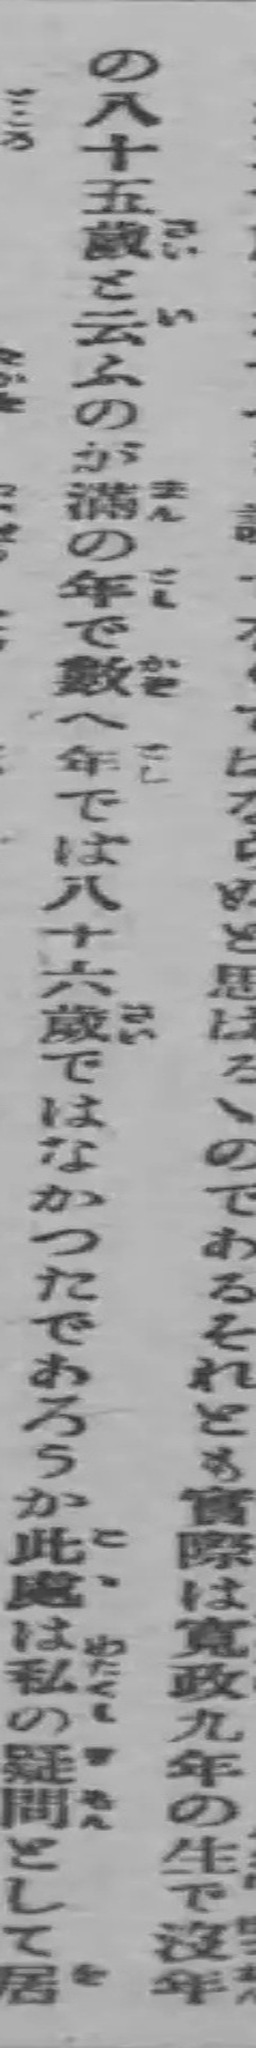の八十五歳と云ふのが満の年で数へ年では八十六歳ではなかつたであろうか此処は私の疑問として居
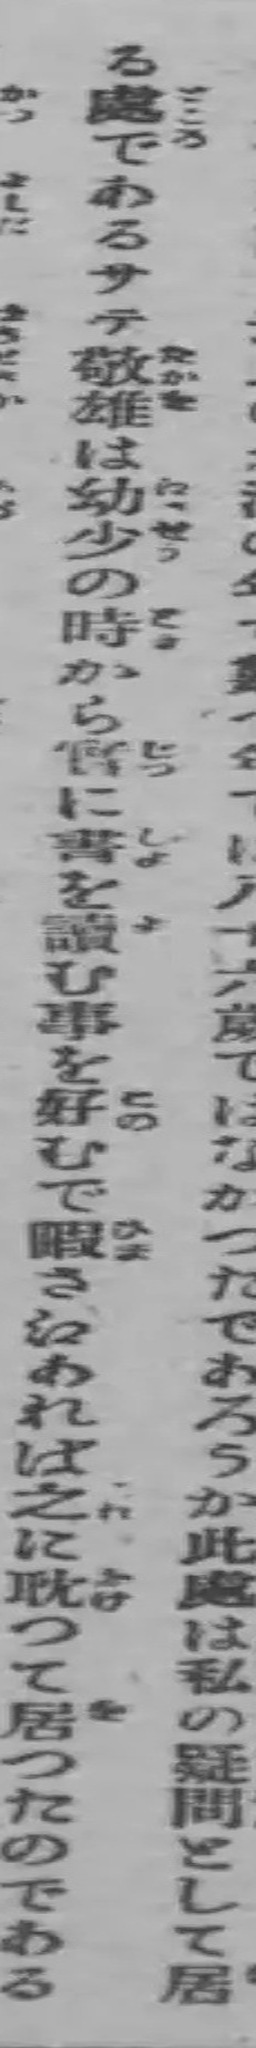る処であるサテ敬雄は幼少の時から実に書を読む事を好むで暇さえあれば之に耽つて居つたのである
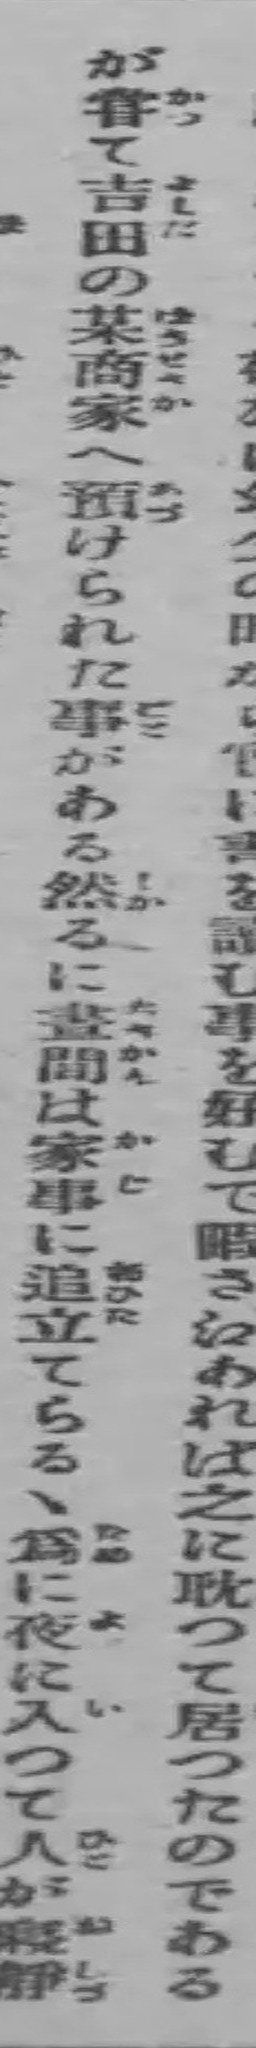が嘗て吉田の某商家へ預けられた事がある然るに昼間は家事に追立てらるゝ為に夜に入つて人が寝静
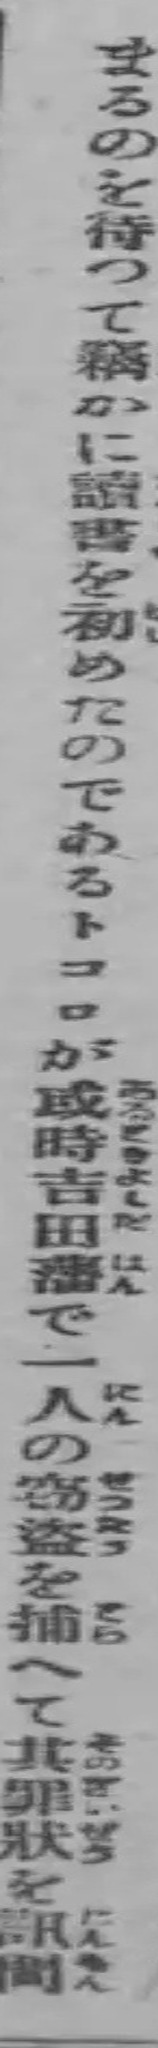まるのを待つて竊かに読書を初めたのであるトコロが或時吉田藩で一人の窃盗を捕へて其罪状を訊問
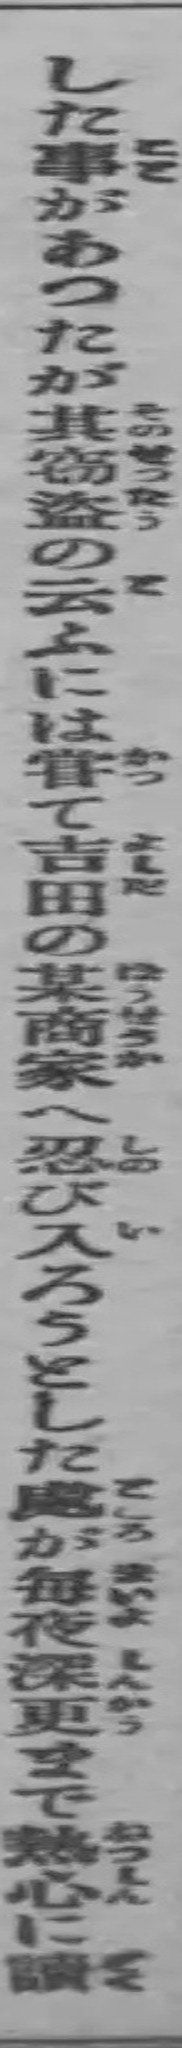した事があつたが其窃盗の云ふには嘗て吉田の某商家へ忍び入ろうとした処が毎夜深更まで熱心に読
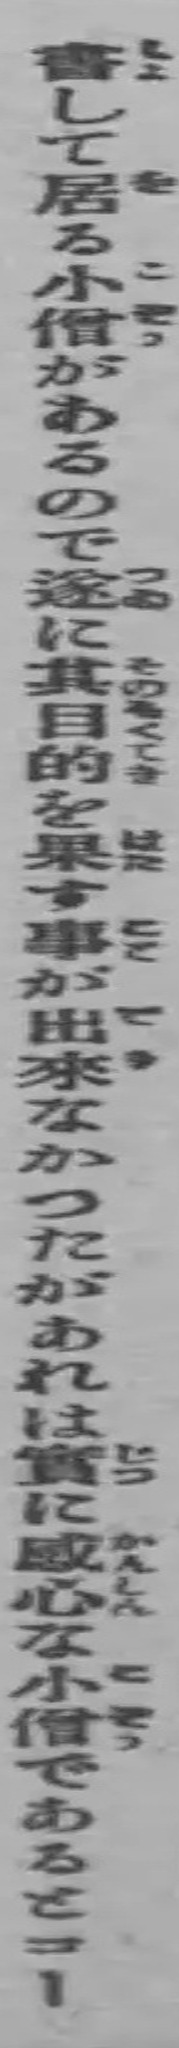書して居る小僧があるので遂に其目的を果す事が出来なかつたがあれは実に感心な小僧であるとコー
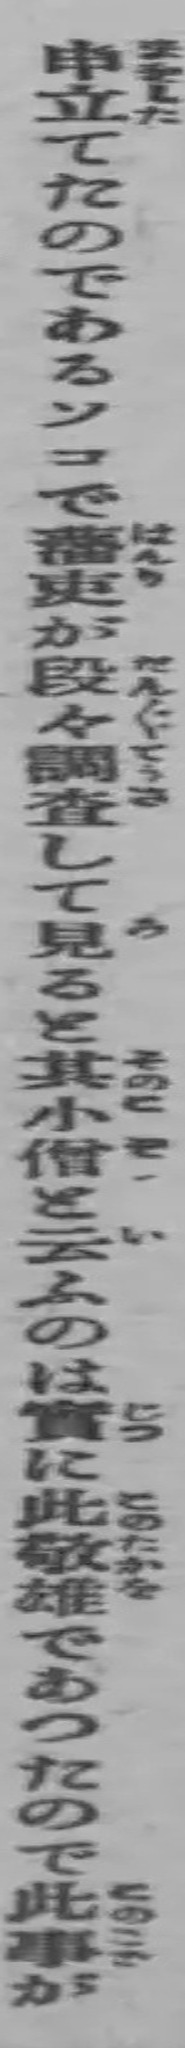申立てたのであるソコで藩吏が段々調査して見ると其小僧と云ふのは実に此敬雄であつたので此事が
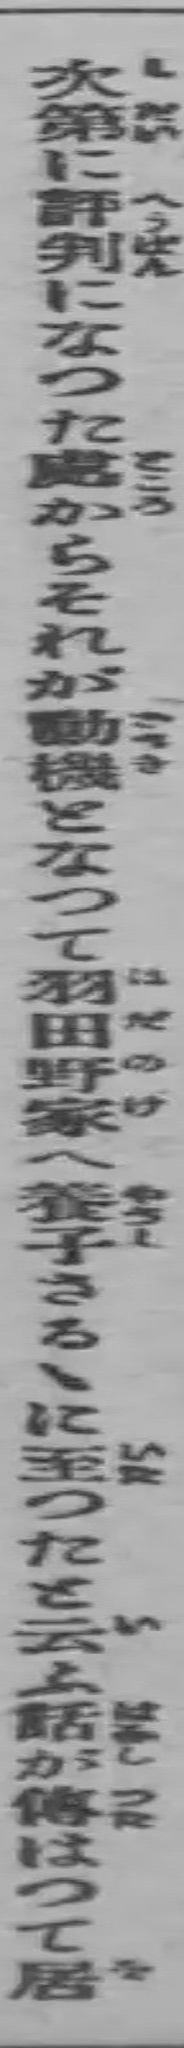次第に評判になつた処からそれが動機となつて羽田野家へ養子さるゝに至つたと云ふ話が伝はつて居
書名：豊橋市史談
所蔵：国立国会図書館 National Diet Library, JAPAN
